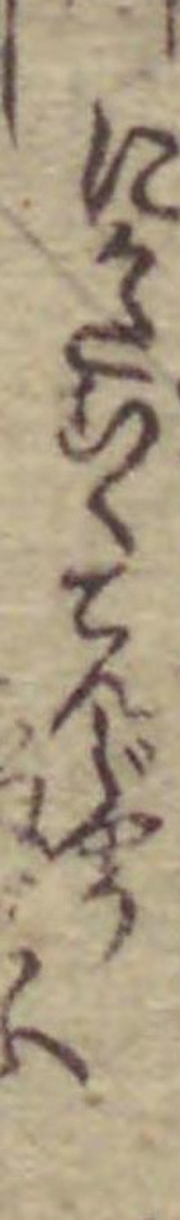にかたむくてんじやう
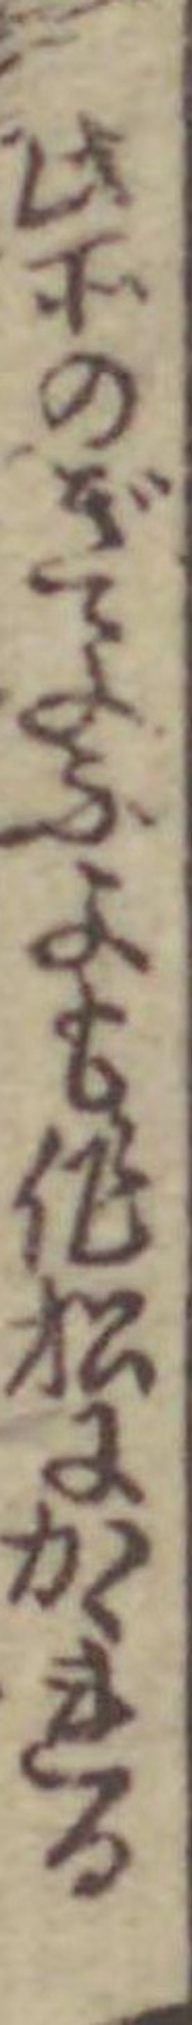此所のぎよふよも作松にかゝれる
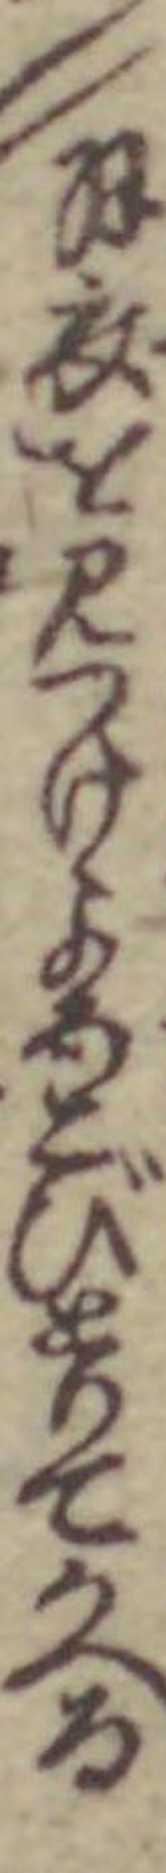羽衣を見つけよろこびとりてかへる
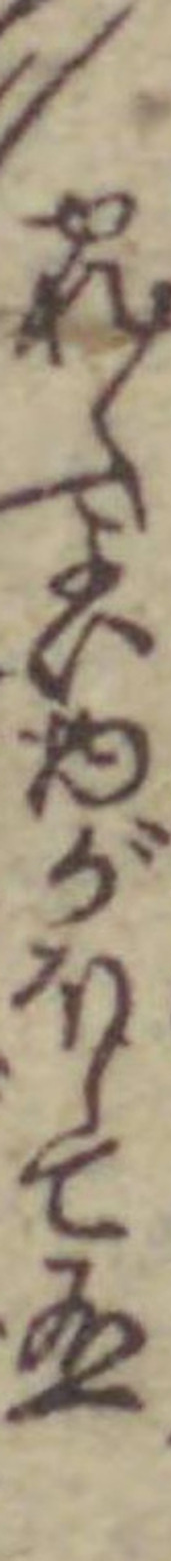やれ〳〵よい物がほして有
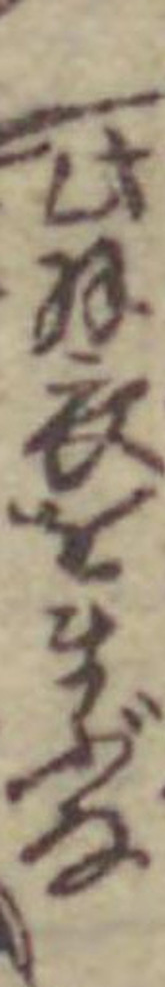此羽衣をまぶな
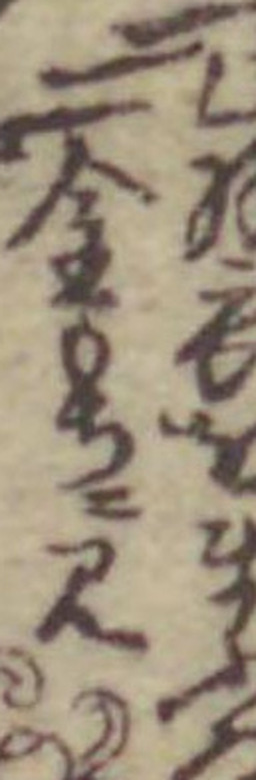金もちに見
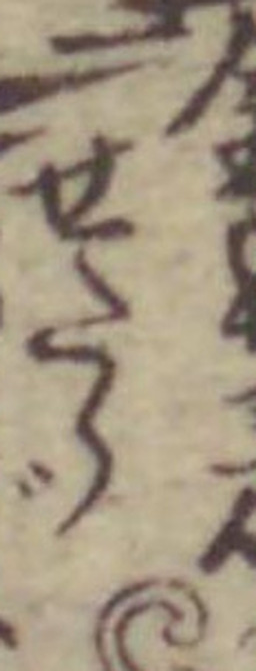せたら
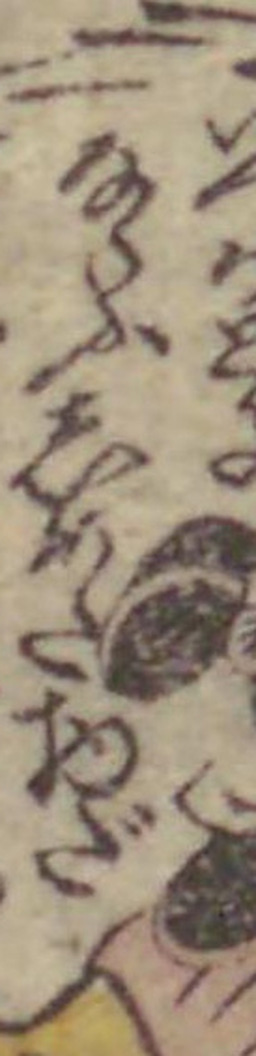ならふしめた物だ
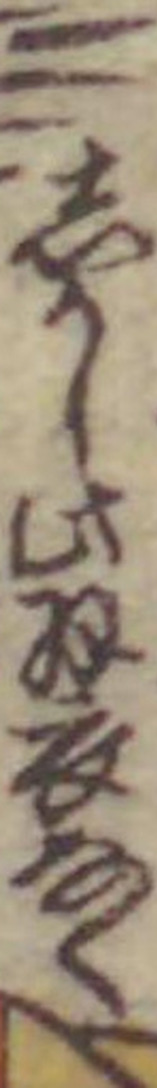しかし此羽衣なく
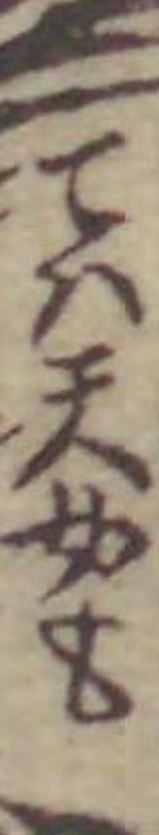ては天女も
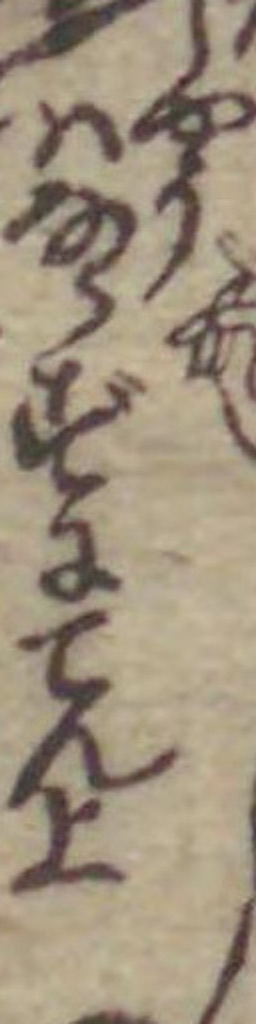はならずにてん上
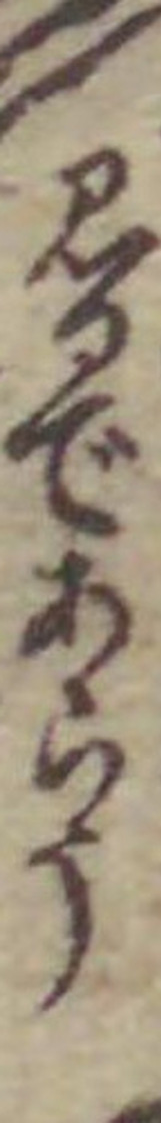見るであらう
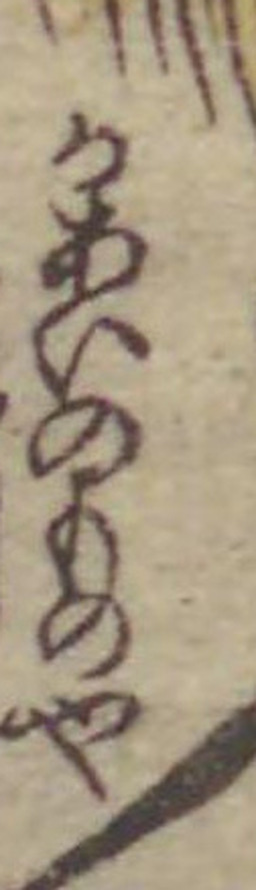かあいのものや
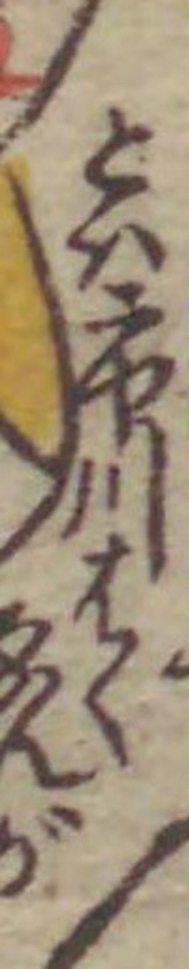とは市川はく
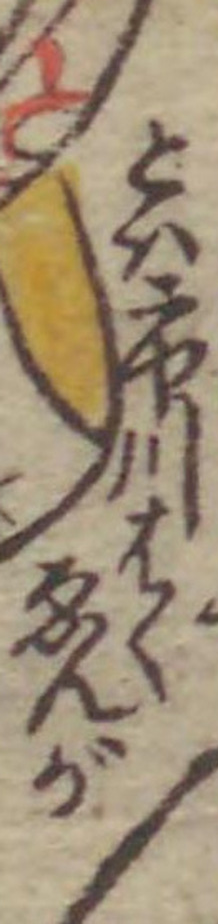ゑんが
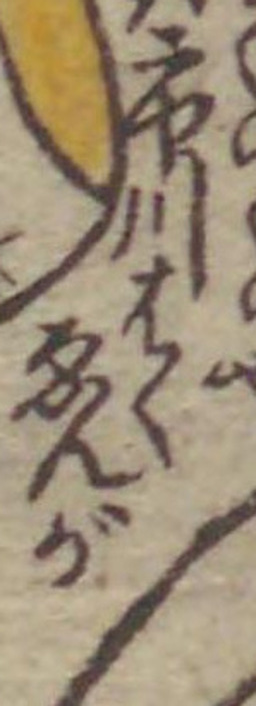ゑんが
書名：娜二代鉢木 5巻
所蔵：国立国会図書館 National Diet Library, JAPAN
